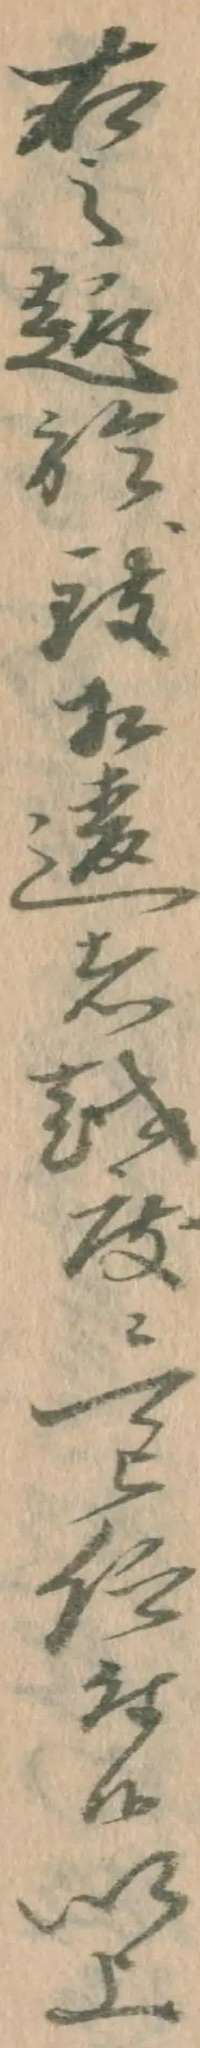右之趣於致相違者越度に可被仰付以上
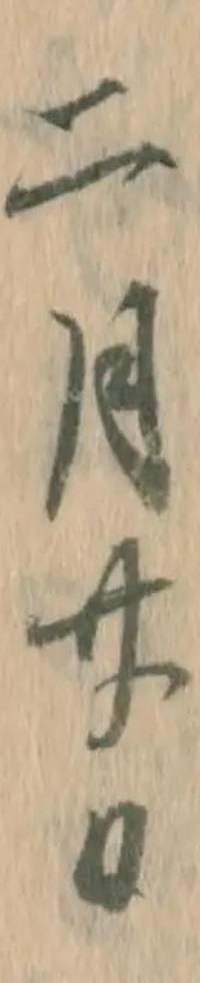二月廿日
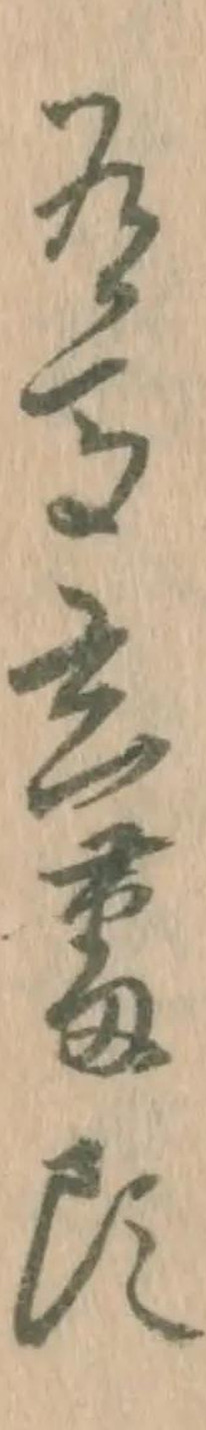有馬玄蕃頭
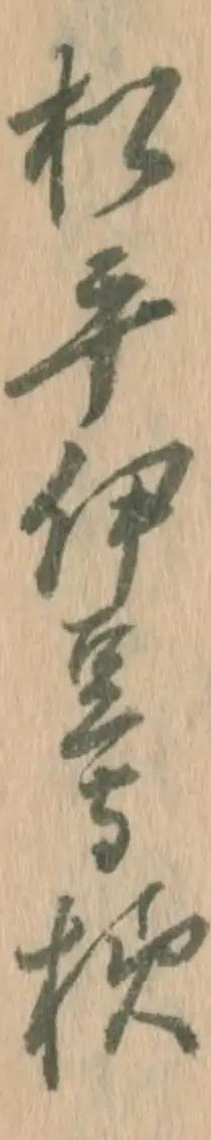松平伊豆守様
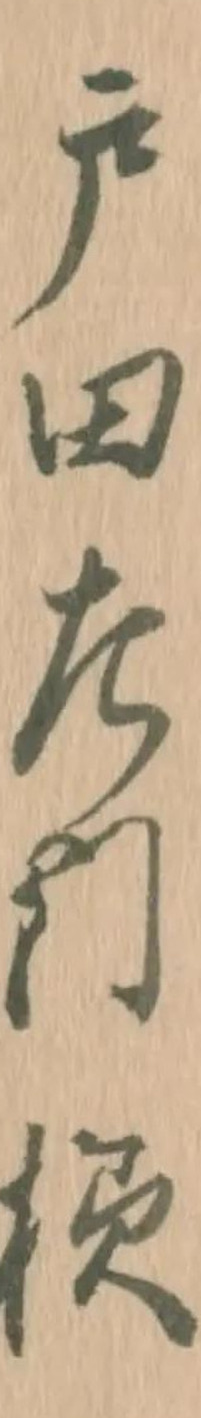戸田左門様
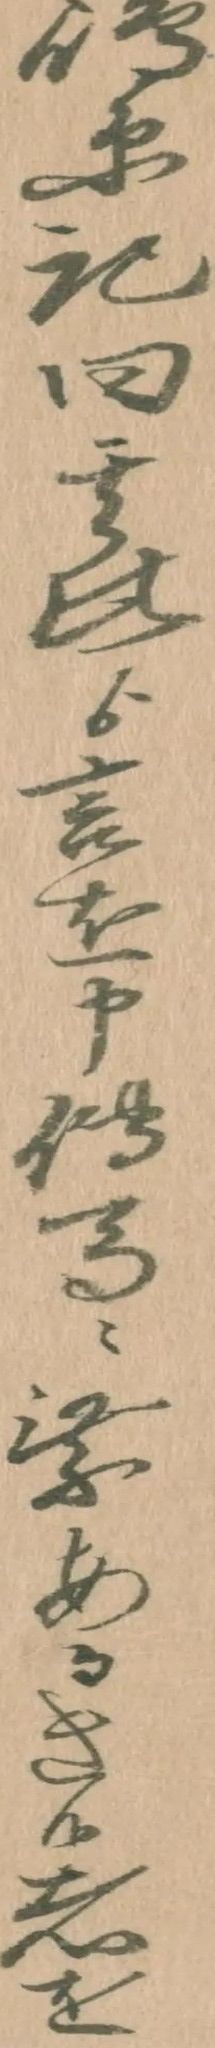島原記曰其比ゟ言を申伝馬に乗あるき候者を
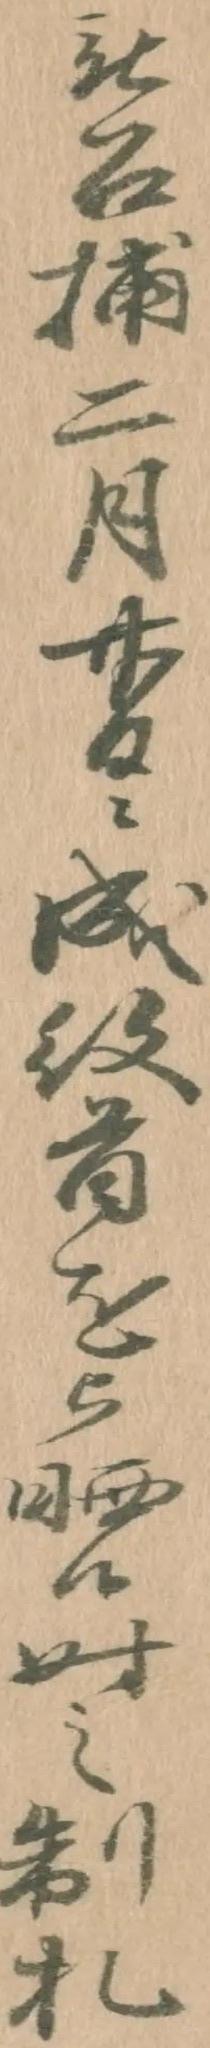被召捕二月廿日に成絶首を被晒候時之制札
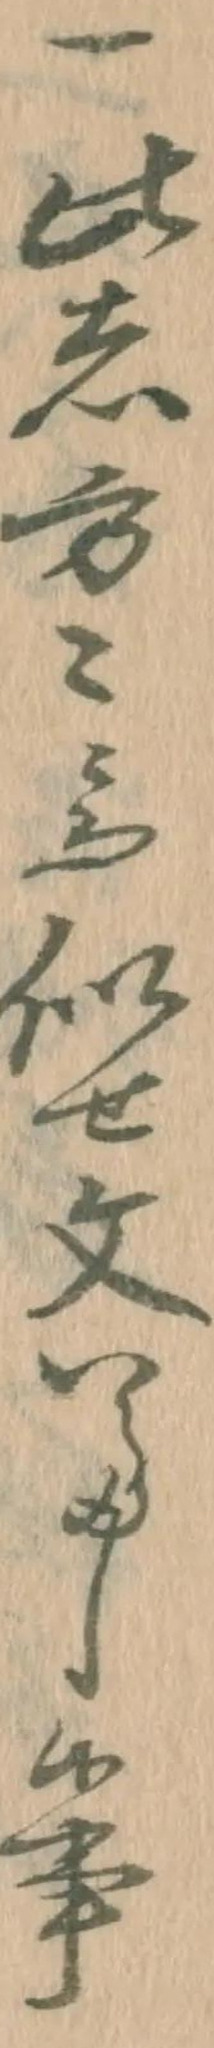一此者方々に而仰せ文い多し候事
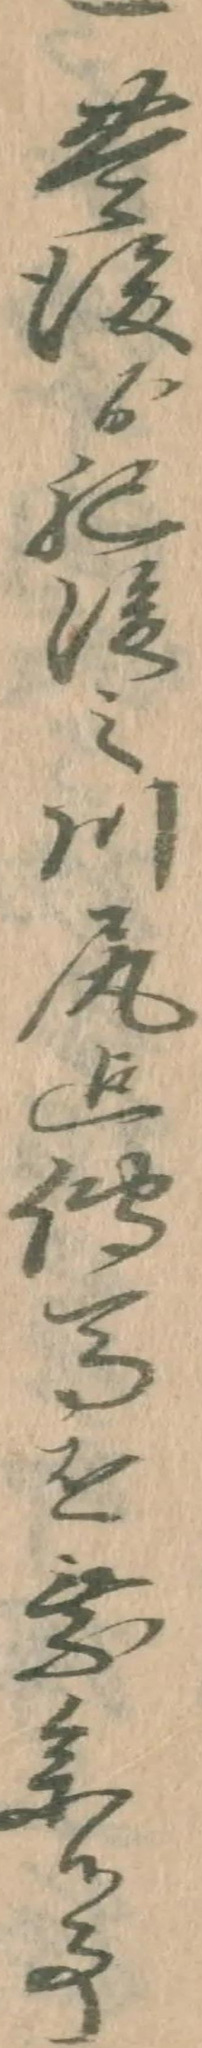一豊後ゟ肥後之川尻迄傳馬を乗参候事
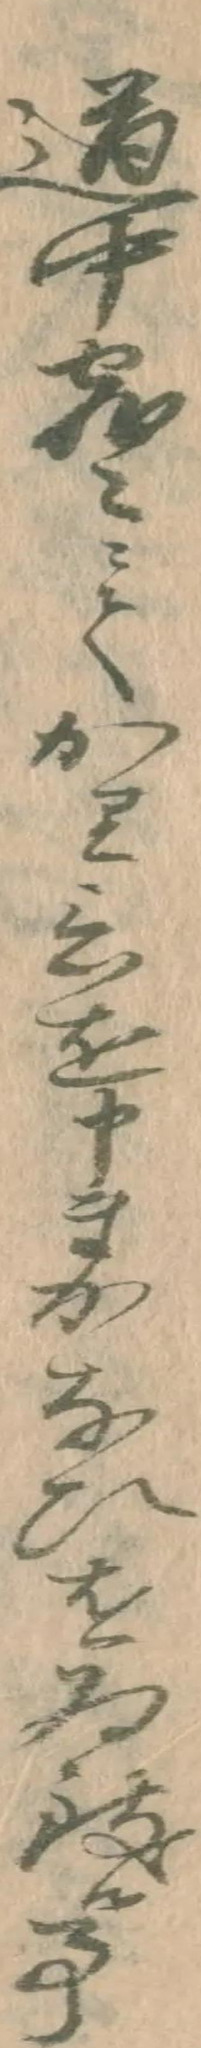一道中究々にてか里言を申まかなひを為致候事
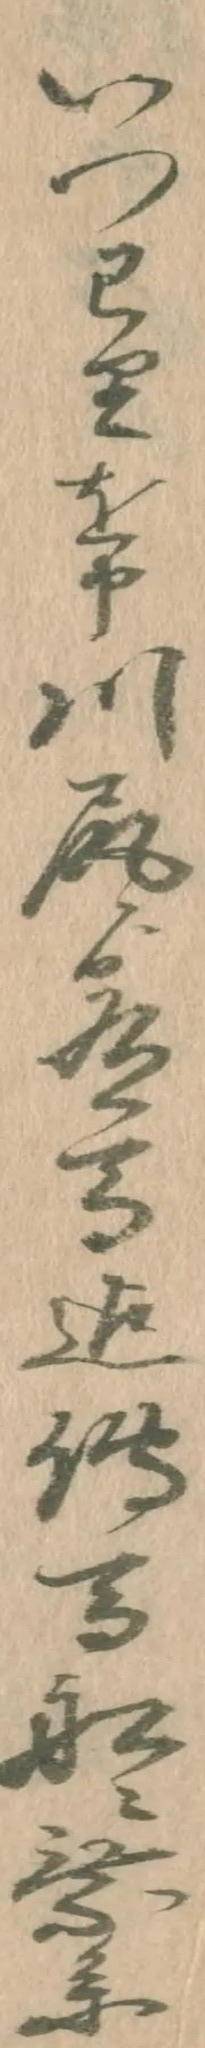一いつわ里を申川尻ゟ有馬迄傳馬舩に乗参
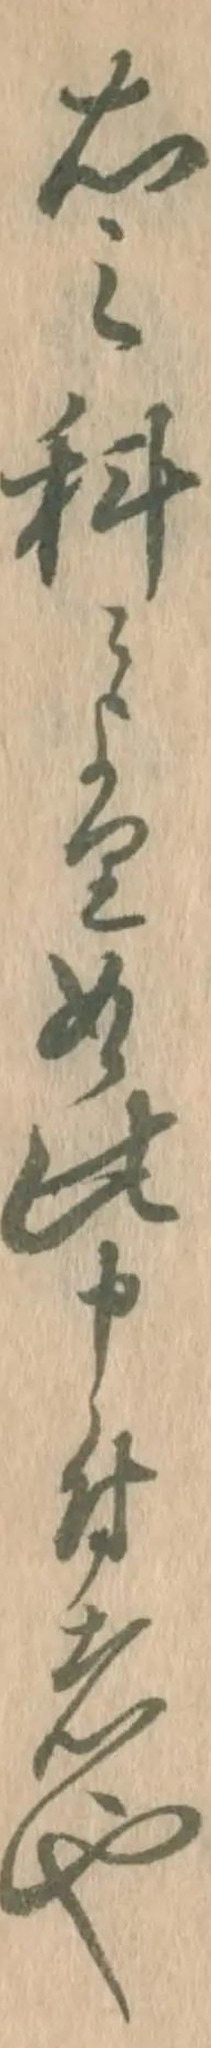右之科によ里如此申付者也
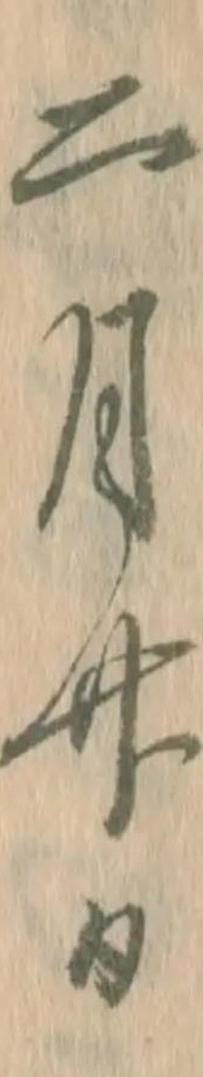二月廿日

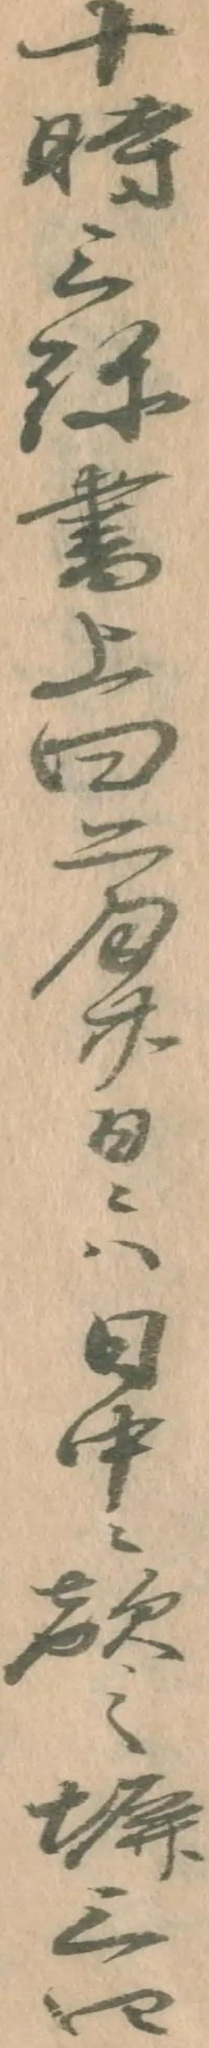十時三弥書上曰二月廿日には日中の敵之塀三四
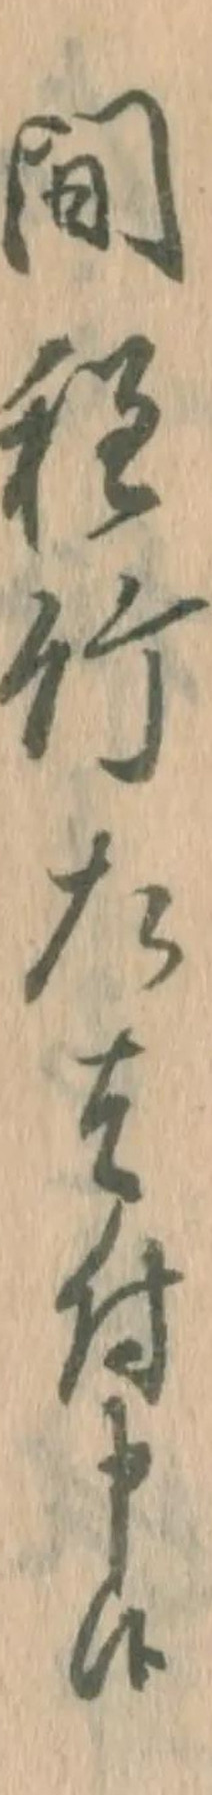間程竹た者付申候
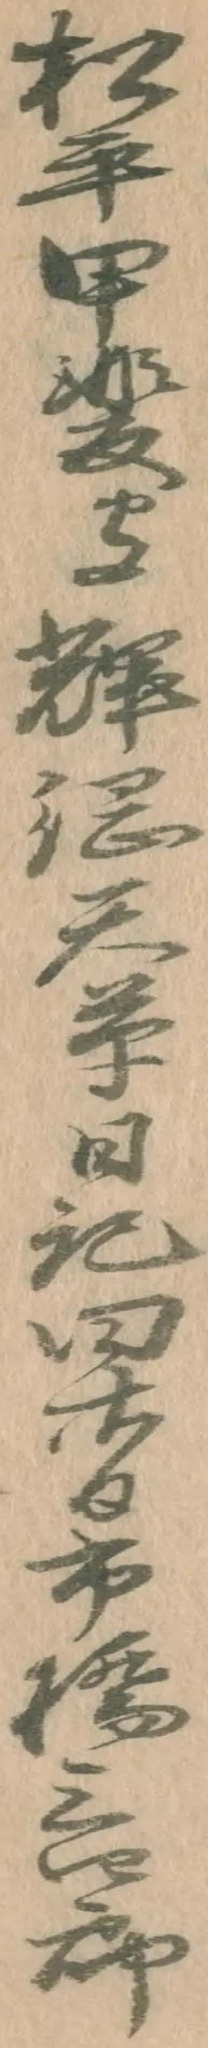松平甲斐守輝綱天草日記曰廿日市橋三四郎
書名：切支丹御退治記 49巻. [6]
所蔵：国立国会図書館 National Diet Library, JAPAN
